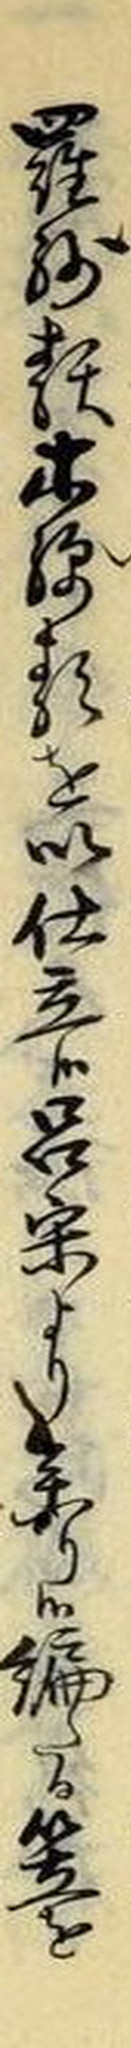羅紗類木綿類を以仕立候呂宋より参り候編たる笠を
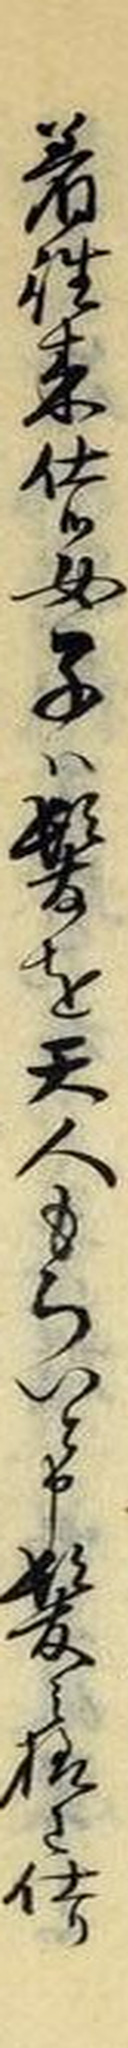着往来仕候女子ハ髪を天人もらいと申髪之様に仕り
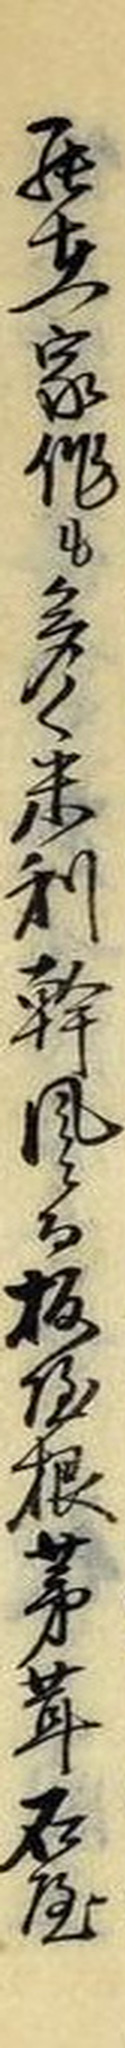罷在家作も多く米利幹風ニ而板屋根茅葺石屋
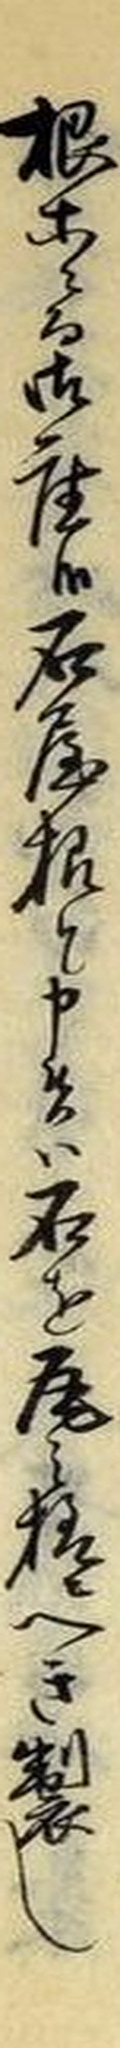根等ニ而御座候石屋根と申候ハ石を瓦之様ニへき製し
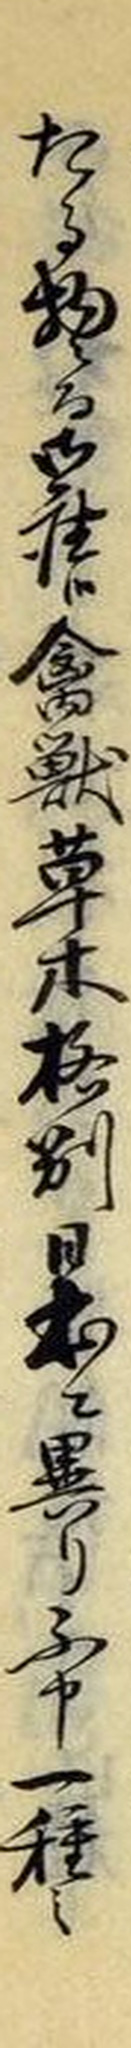たる物ニ而御座候禽獣草木格別日本と異り不申一種之
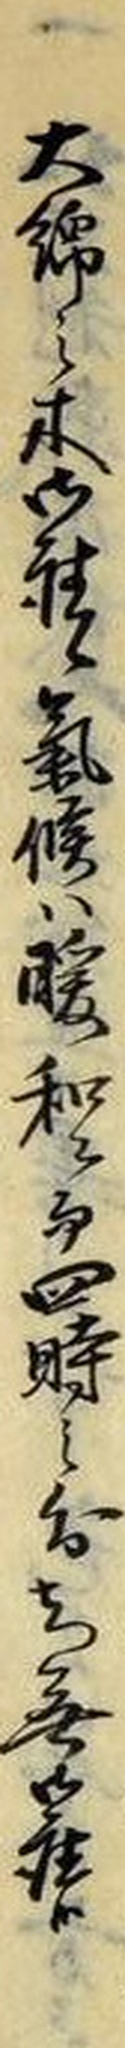大綿之木御座候気候ハ暖和ニ而四時之分知無御座候

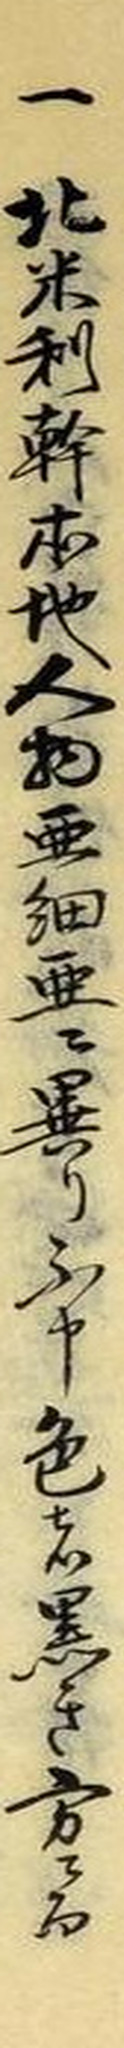一北米利幹本地人物亜細亜二異り不申色者黒き方ニ而
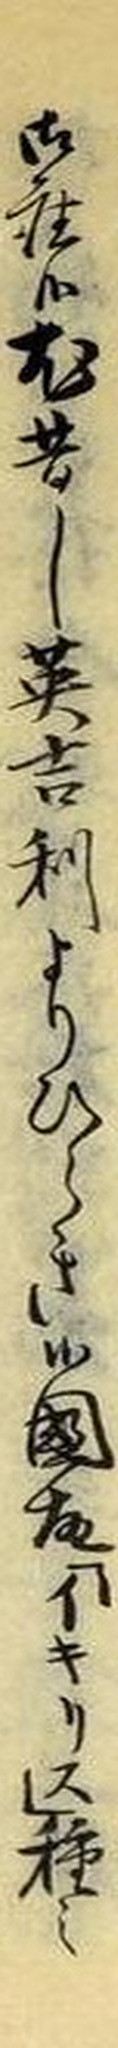御座候尤昔し英吉利よりひらき候国故「イキリス」種之
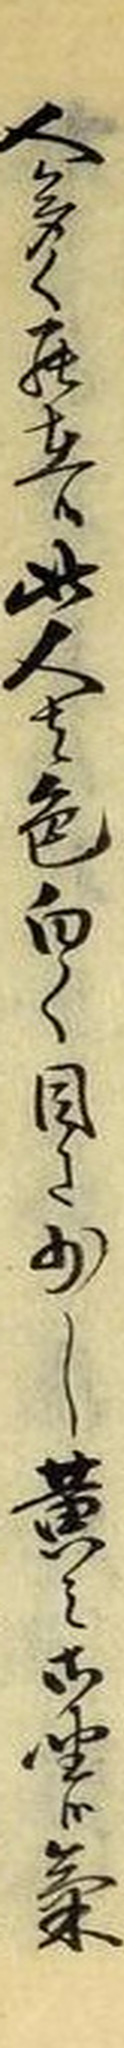人多く罷在候此人者色白く目に少し黄ミ御座候気
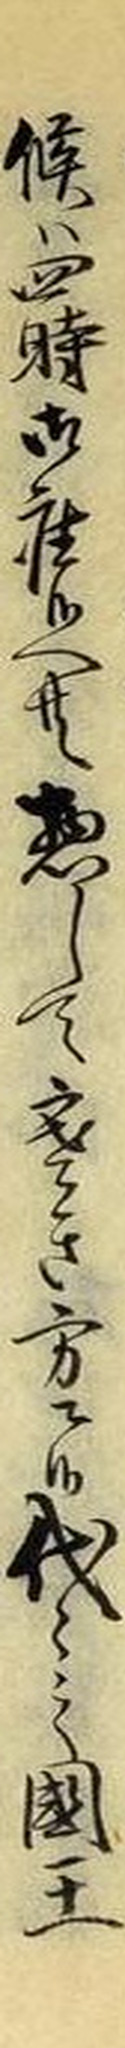候ハ四時御座候へ共惣して寒き方ニ候代々之国王
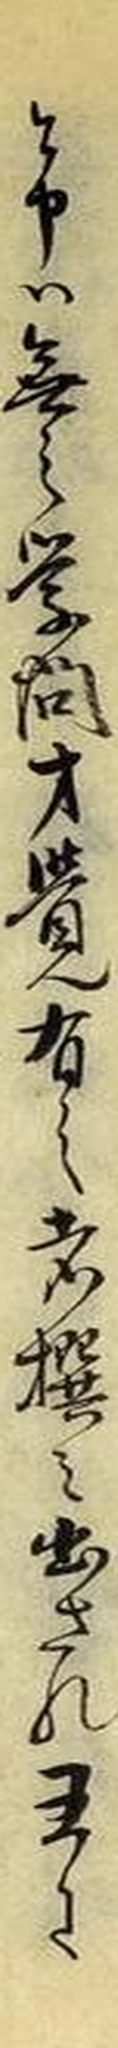と申ハ無之学問才覚有之者撰之出され王に
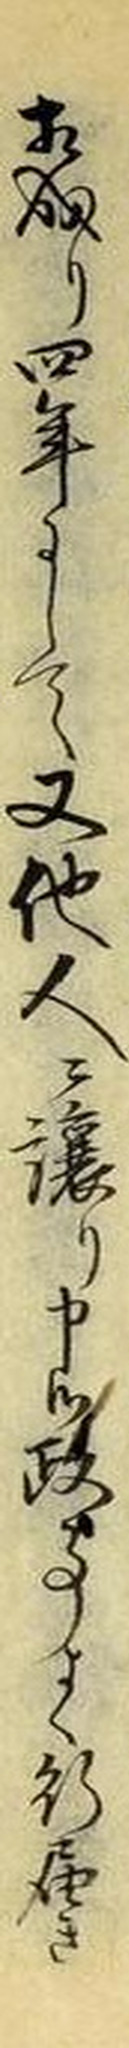相成り四年にして又他人ニ譲り申候政事よく行届き
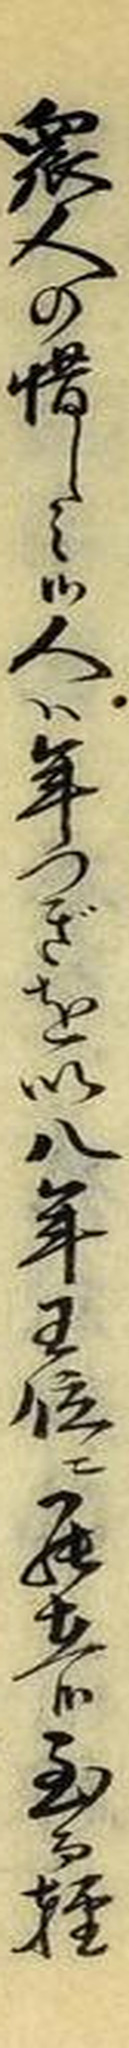衆人の惜しミ候人ハ年つぎを以八年王位ニ罷在候至而軽
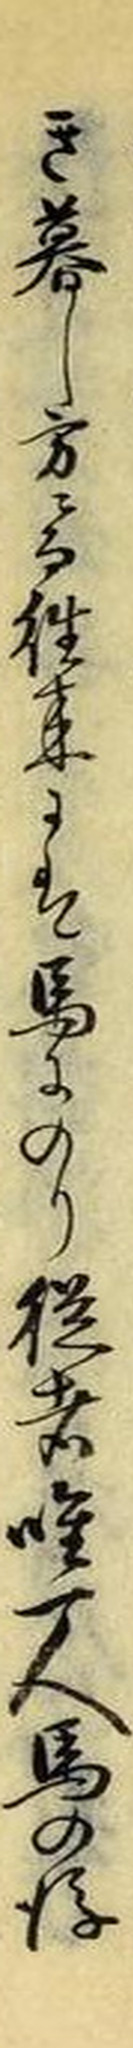き暮し方ニ而往来には馬にのり従者唯一人馬の後
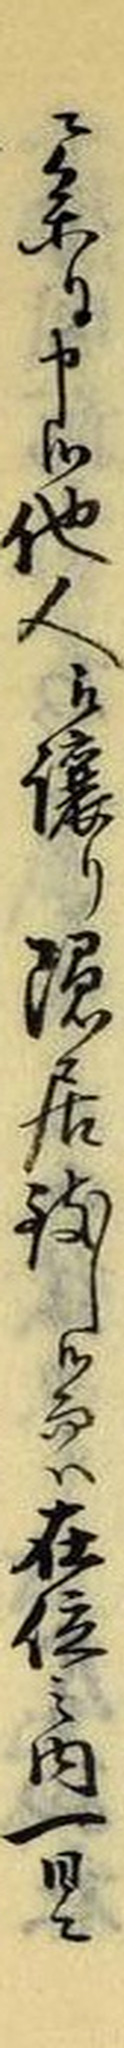ニ参り申候他人江譲り隠居致し候而ハ在位之内一日二
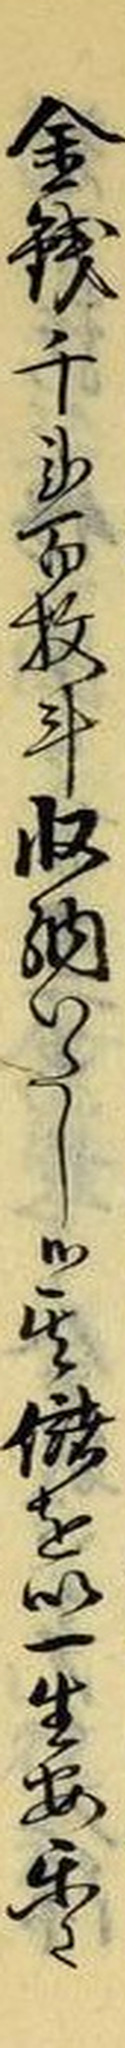金銭千弐百枚計収納いたし候其儲を以一生安楽に
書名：漂客談奇（備考雑録写8）
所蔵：福井県文書館 Fukui Prefectural Archives
